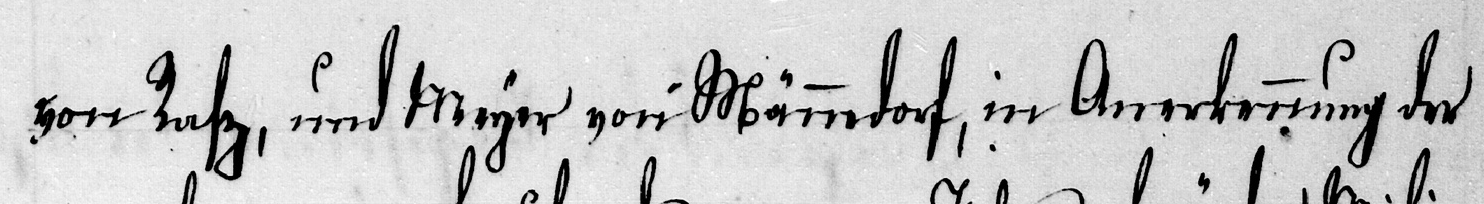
von Rafz, und Meyer von Männedorf, in Anerkennung der
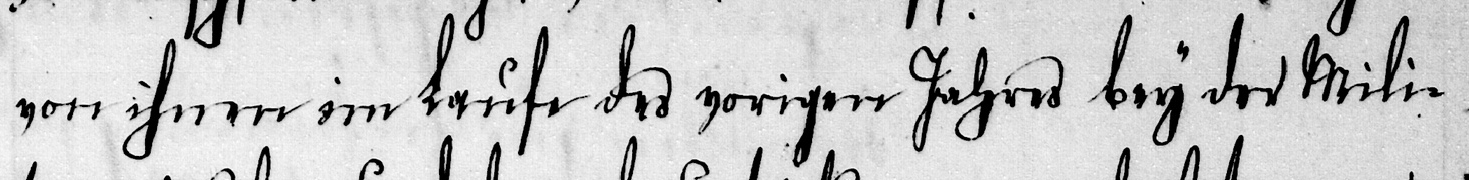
von ihnen im Laufe des vorigen Jahres bey der Mili¬
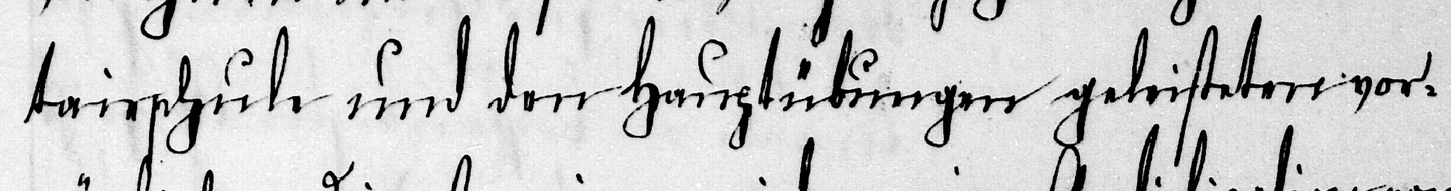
tairschule und den Hauptübungen geleisteten vor¬
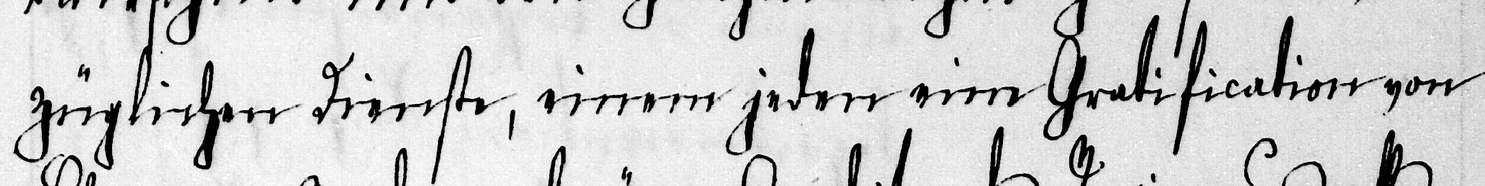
züglichen Dienste, einem jeden eine Gratification von
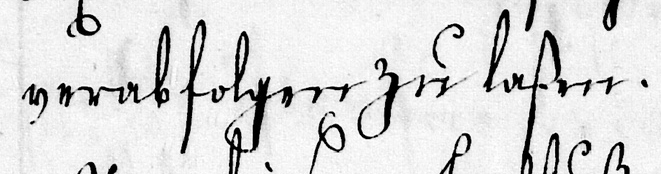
verabfolgen zu laßen.
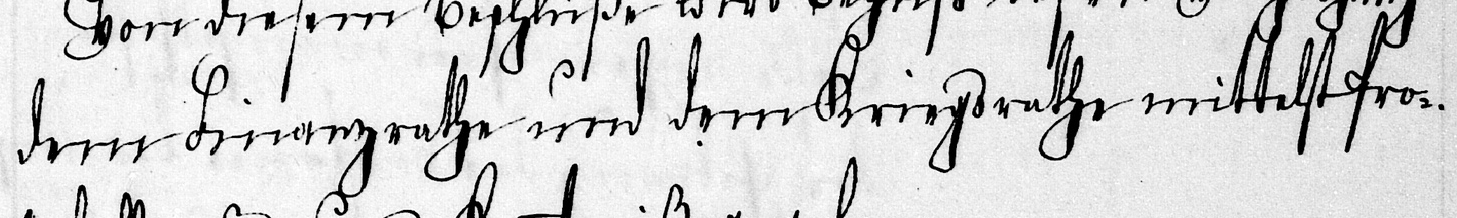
dem Finanzrathe und dem Kriegsrathe mittelst Pro¬
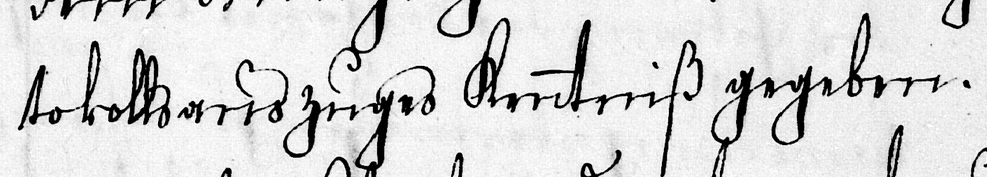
tokollsauszuges Kenntniß gegeben.
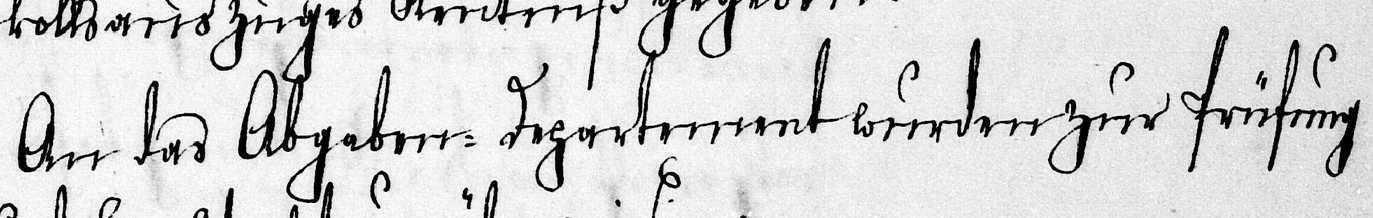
An das Abgaben-Departement wurden zur Prüfung
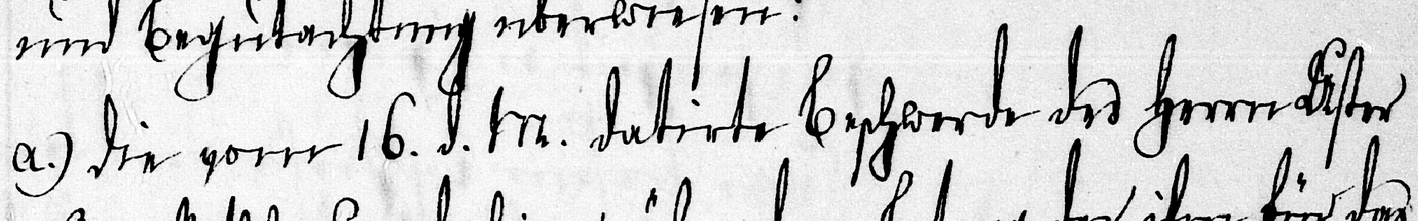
a.) Die vom 16. d. M. datirte Beschwerde des Herrn Uster
